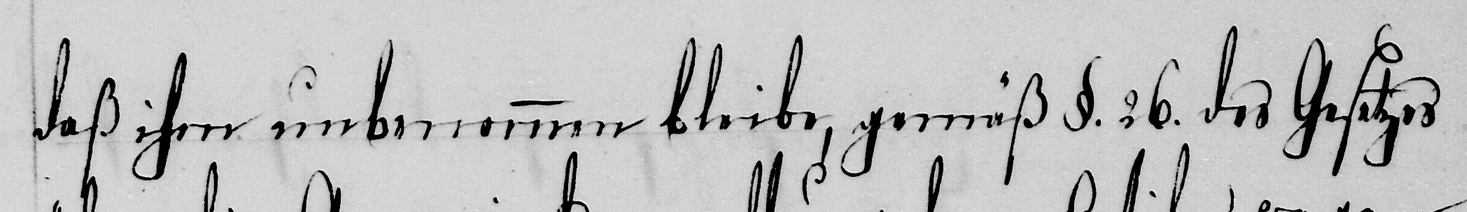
daß ihm unbenommen bleibe, gemäß §. 26. des Gesetzes
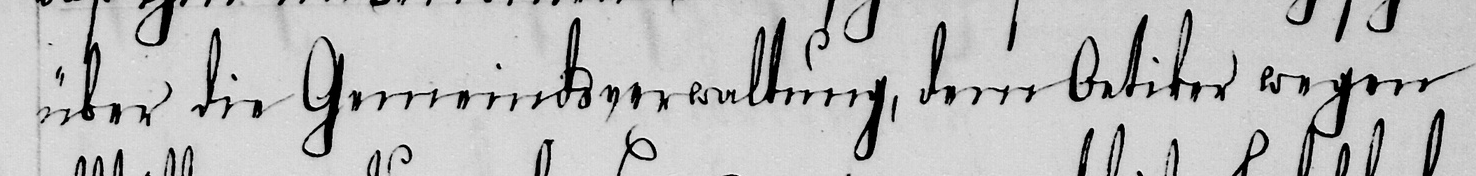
über die Gemeindsverwaltung, dem Oetiker wegen
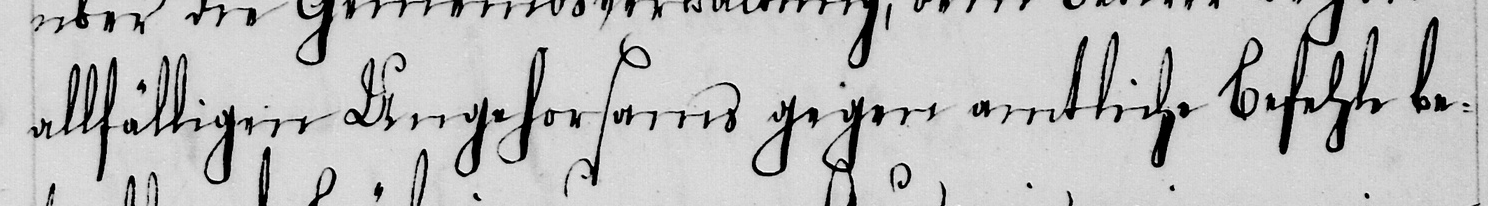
lfälligen Ungehorsams gegen amtliche Befehle be¬
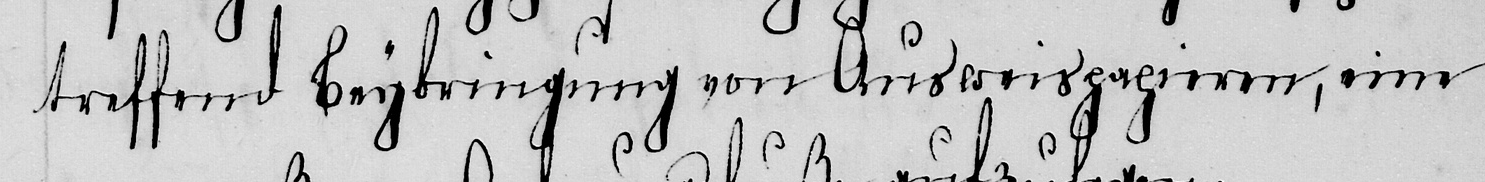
treffend Beybringung von Ausweispapieren, eine
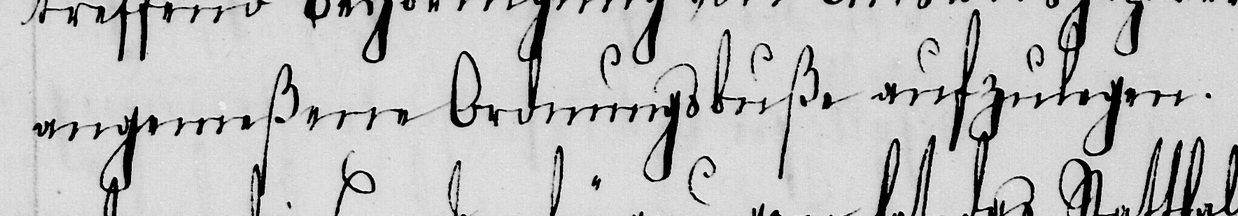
angemeßene Ordnungsbuße aufzulegen.
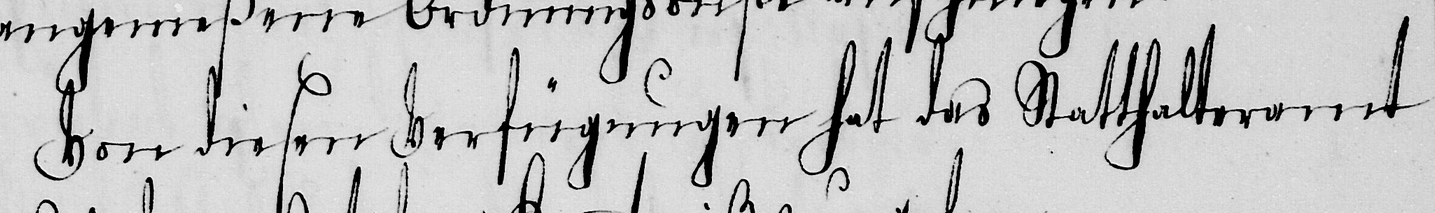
Von diesen Verfügungen hat das Statthalteramt
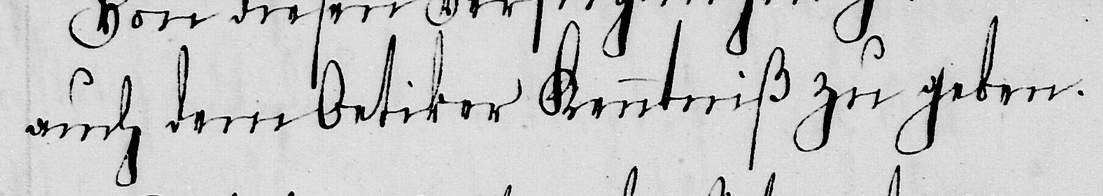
auch dem Oetiker Kenntniß zu geben.
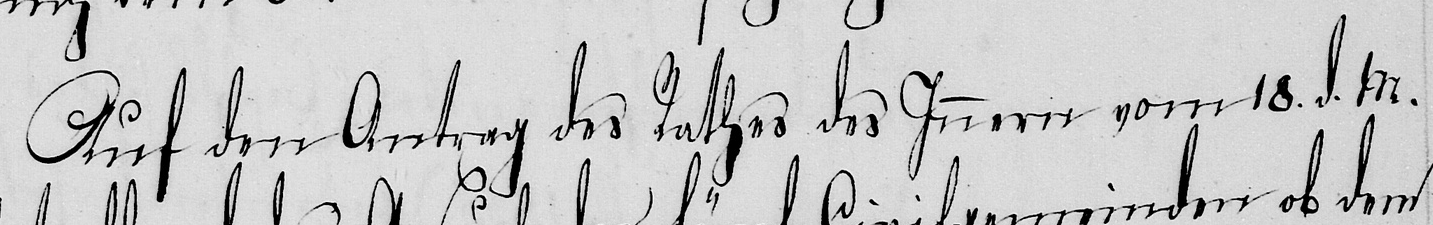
Auf den Antrag des Rathes des Innern vom 18. d. M.
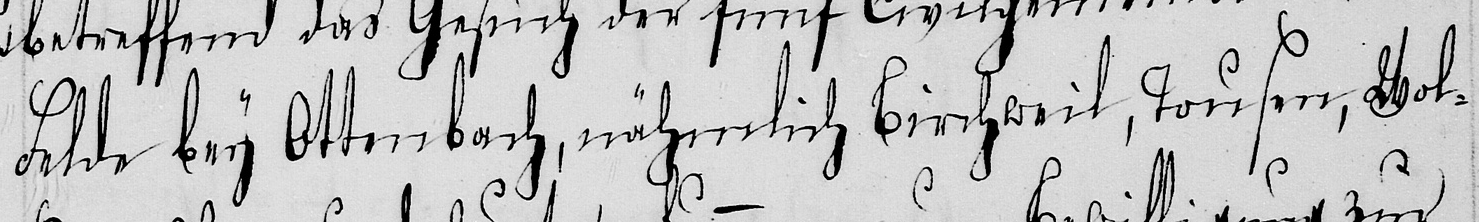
Felde bey Ottenbach, nähmlich Birchweil, Tousen, Wol¬
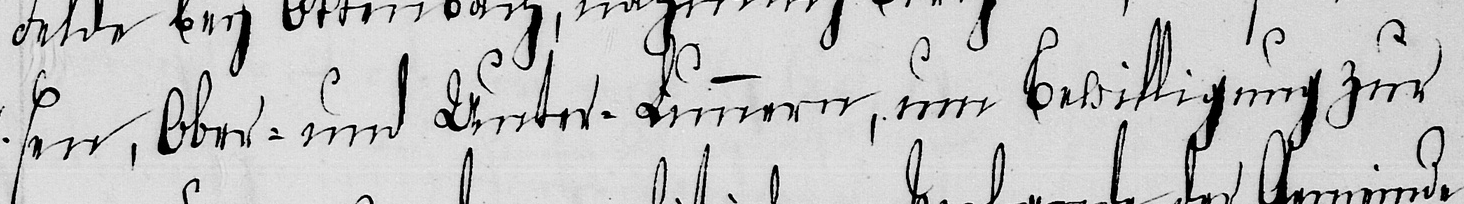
sen, Ober- und Unter-Lummern, um Bewilligung zur
